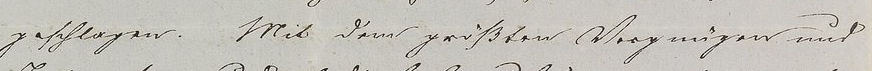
geschlagen. Mit dem größten Vergnügen und
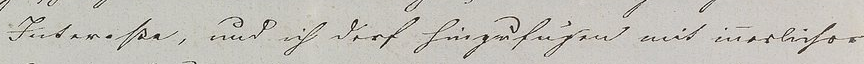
Intereße, und ich darf hinzufügen mit innerlicher
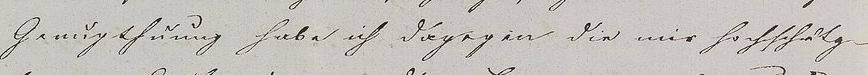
Genugthuung habe ich dagegen die mir hochschätz-
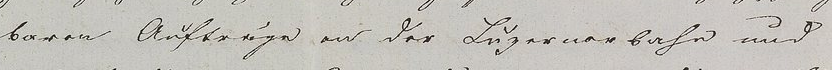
baren Aufträge an der Luzernerbahn und
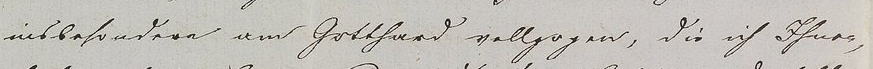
insbesondere am Gotthard vollzogen, die ich Ihnen,
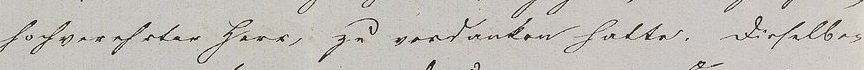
hochverehrter Herr, zu verdanken hatte. Dieselben
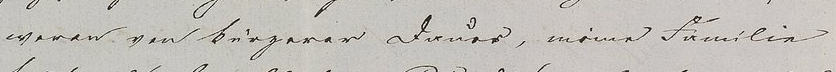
waren von kürzerer Dauer, meine Familie
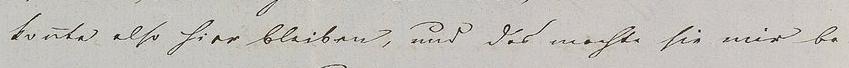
konnte also hier bleiben, und das machte sie mir be-
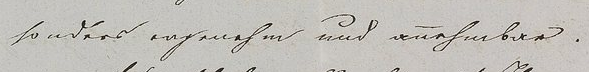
sonders angenehm und annehmbar.
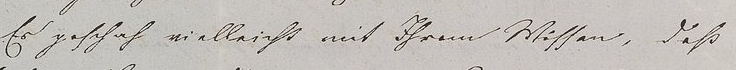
Es geschah vielleicht mit Ihrem Wissen, daß
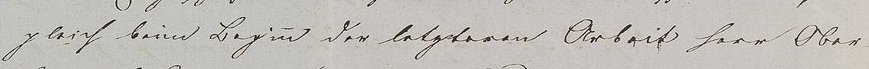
gleich beim Beginn der letzteren Arbeit Herr Ober-
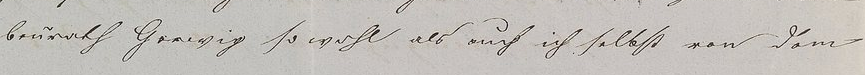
baurath Gerwig so wohl als auch ich selbst von dem
